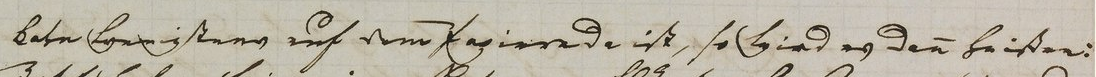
bahn wenigstens auf dem Papiere da ist, so wird es dann heißen:
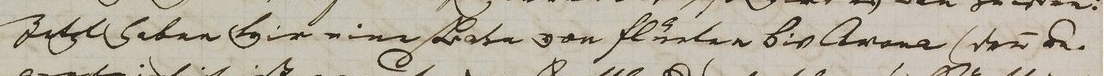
Jetzt haben wir eine Bahn von Flüelen bis Arona (denn au-
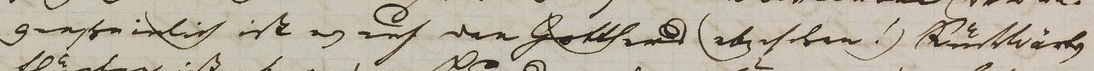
genscheinlich ist es auf den Gotthard abgesehen!) Rückwärts
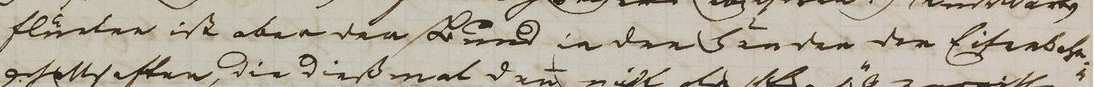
Flüelen ist aber der Bund in den Händen der Eisenbahn-
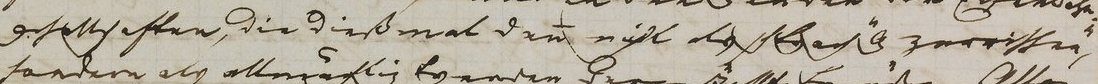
gesellschaften, die dießmal dann nicht als «schwach» & «zerrissen»,
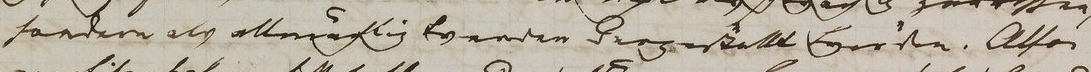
sondern als allmächtig werden dargestellt werden. Also
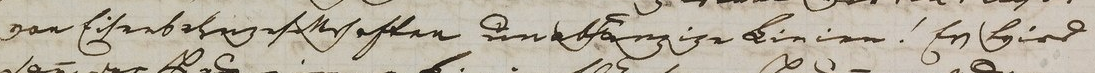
von Eisenbahngesellschaften unabhängige Linien! Es wird
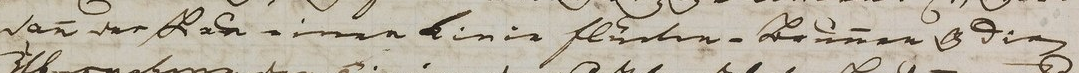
dann der Bau einer Linie Flüelen–Brunnen & die
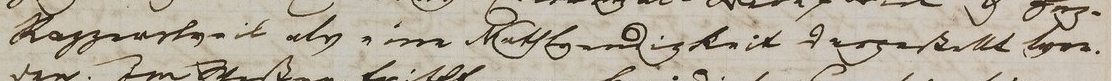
Rappersweil als eine Nothwendigkeit dargestellt wer-
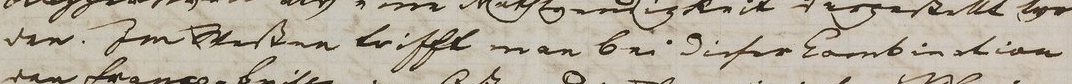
den. Im Westen trifft man bei dieser Combination
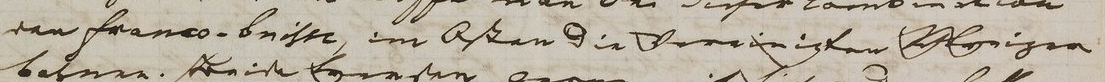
die Franco-Suisse, im Osten die Vereinigten Schweizer-
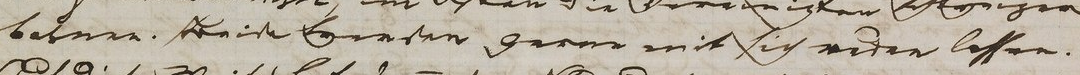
bahnen. Beide werden gerne mit sich reden lassen.
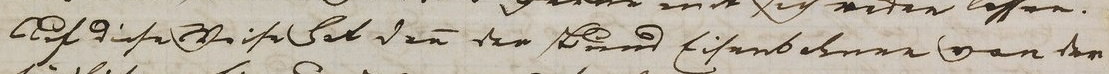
Auf diese Weise hat denn der Bund Eisenbahnen von der
